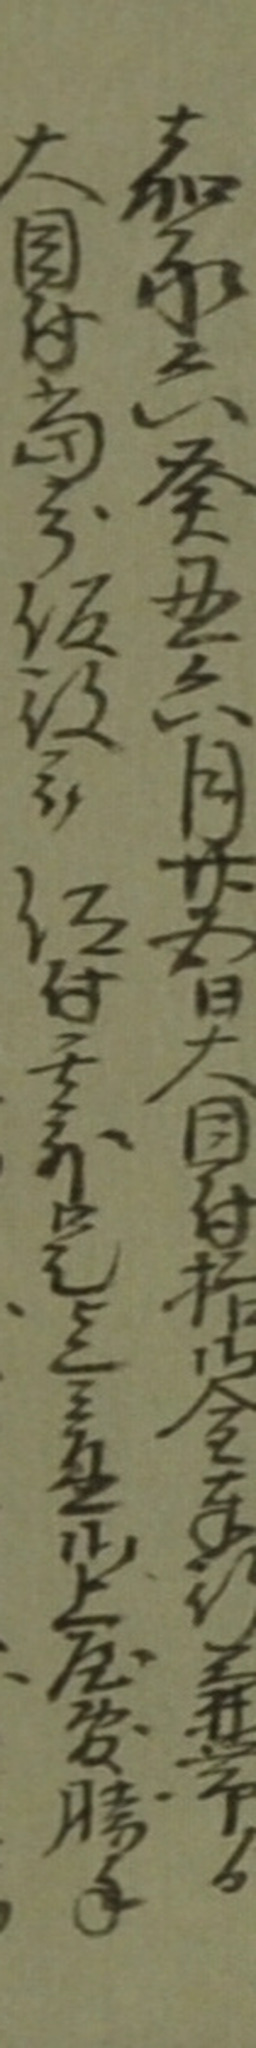大目付当分仮役被仰付其外是迄之通御上屋敷勝手
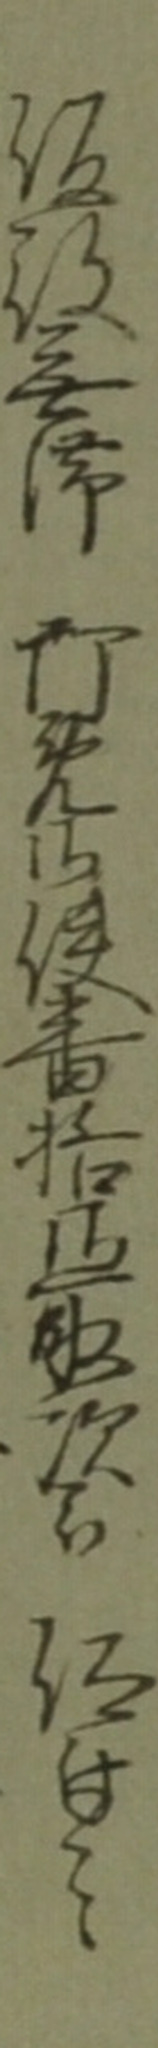仮役無滞御免御使番格御取次被仰付之
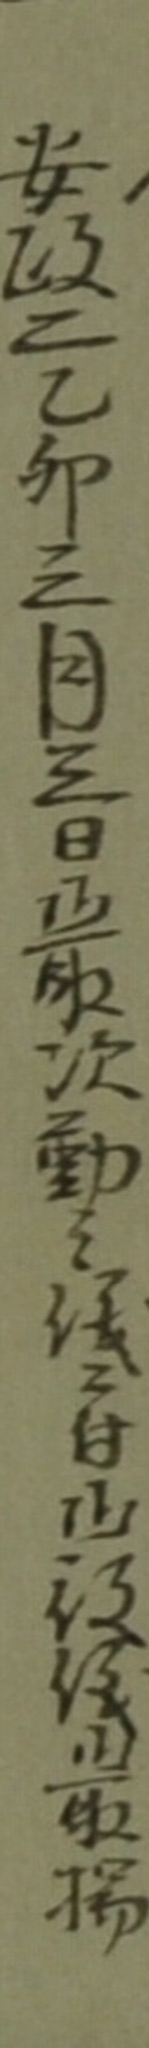一安政二乙卯三月三日御取次之儀ニ付御役儀御取揚
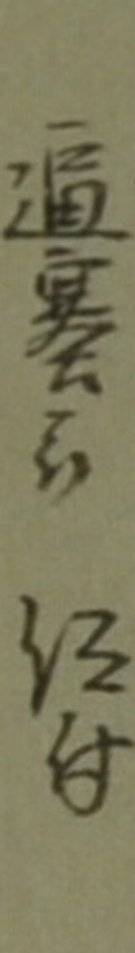逼塞被仰付
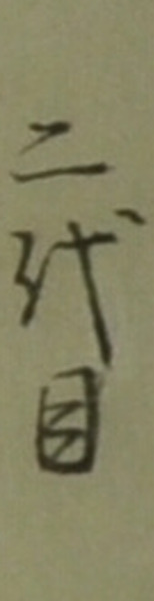二代目
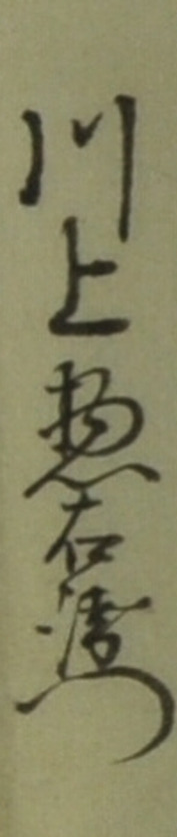川上惣右衛門

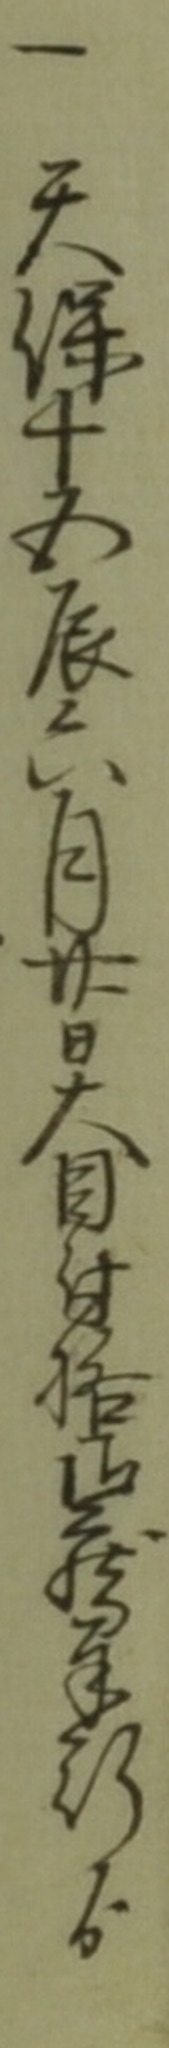一天保十五辰六月廿日大目付格御蔵奉行ゟ
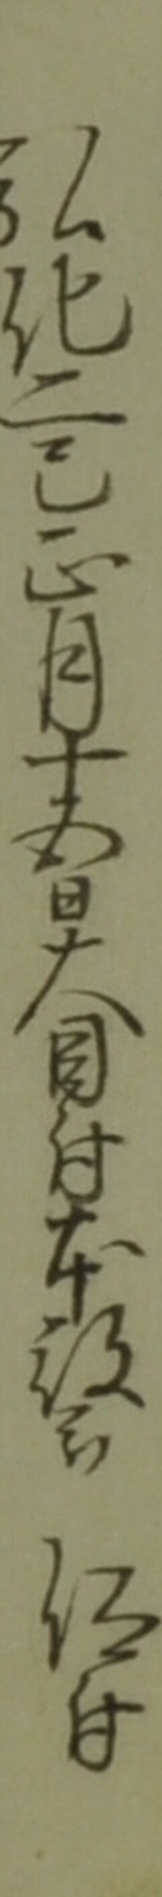一弘化二巳正月十五日大目付本役被仰付
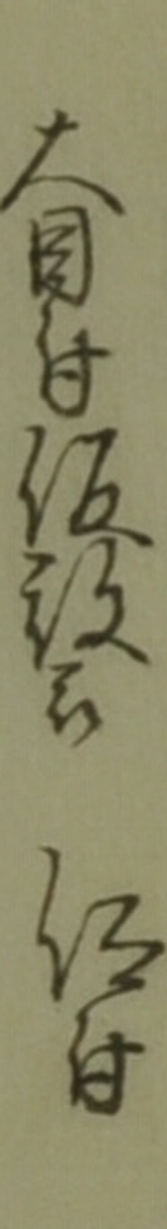大目付仮役被仰付
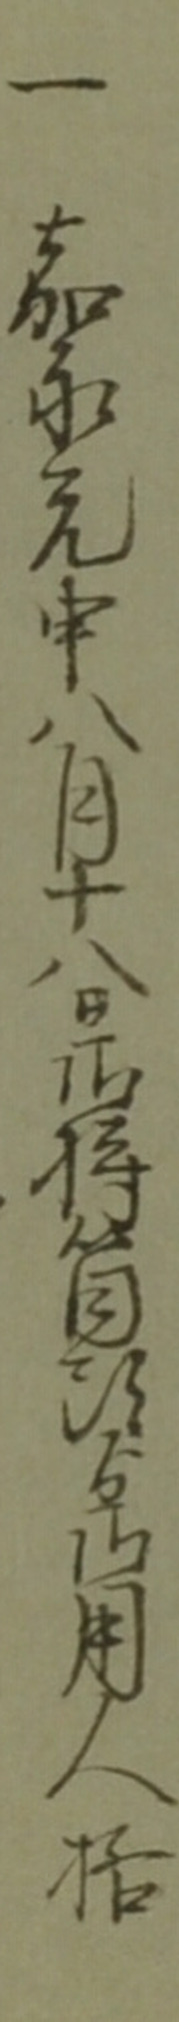一嘉永元申八月十八日御持筒頭ゟ御用人格
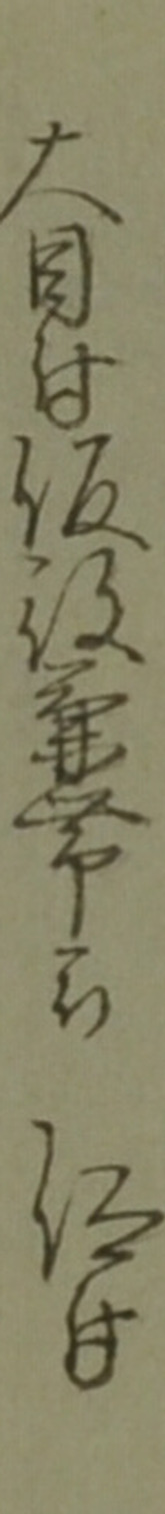大目付仮役兼帯被仰付
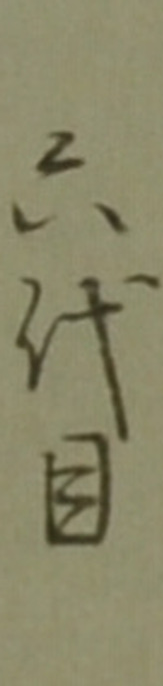六代目
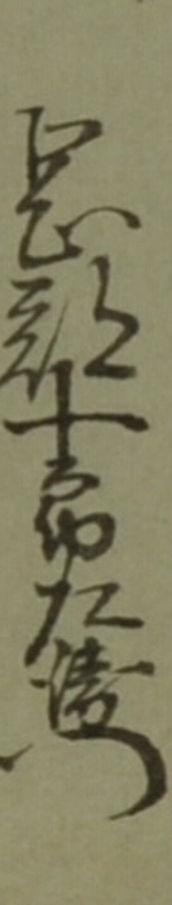岡部十郎左衛門
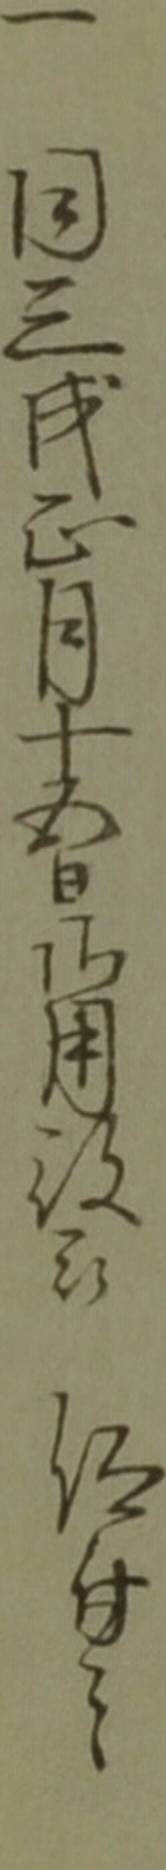一同三戌正月十五日御用役被仰付之
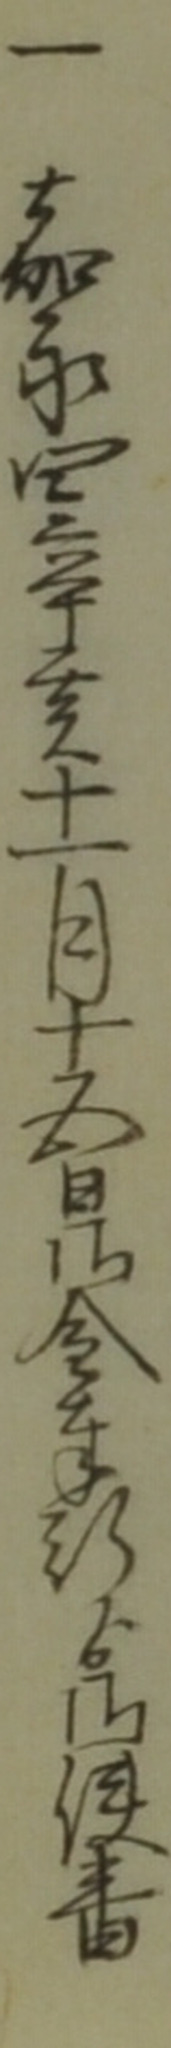一嘉永四辛亥十一月十五日御金奉行ゟ御使番
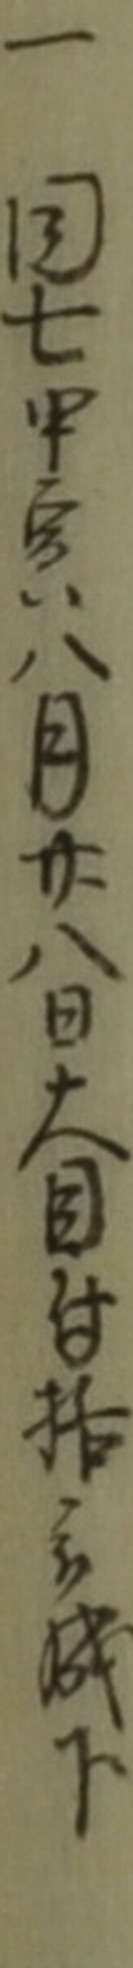一同七甲寅八月廿八日大目付格被成下
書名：諸御役代々録（三）
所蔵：伊那市立高遠町図書館・合同会社AMANE
